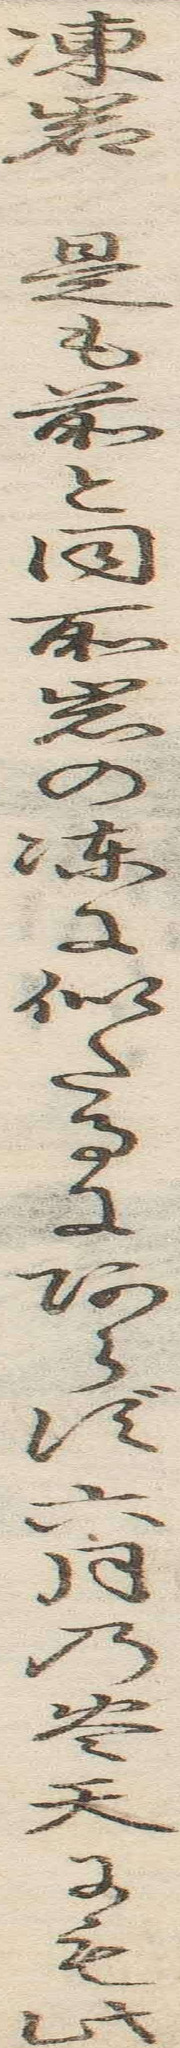凍岩是も前と同所岩の凍に似たるにあらず六月の炎天にも此
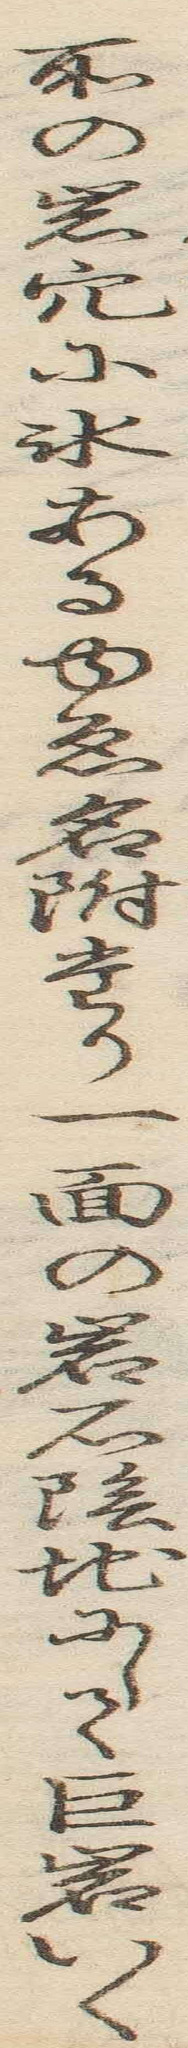所の岩穴に氷あるゆゑ名附たり一面の岩石陰地にして巨岩いく

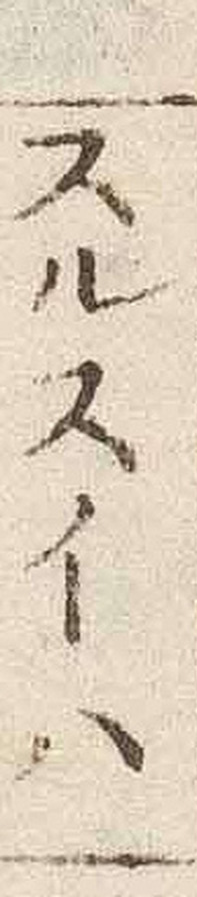スルスイハ
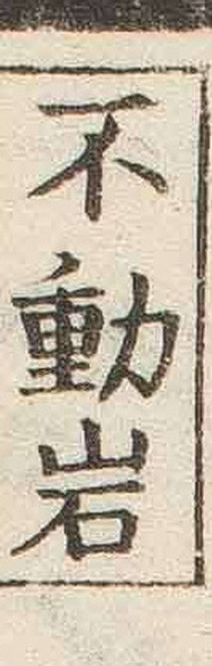不動岩

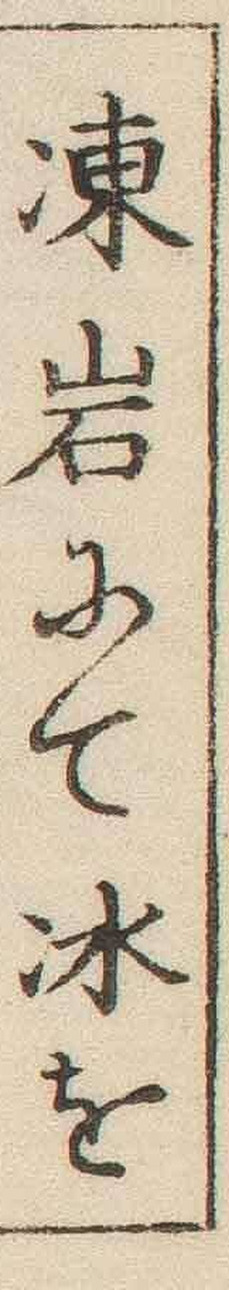凍岩にて冰を
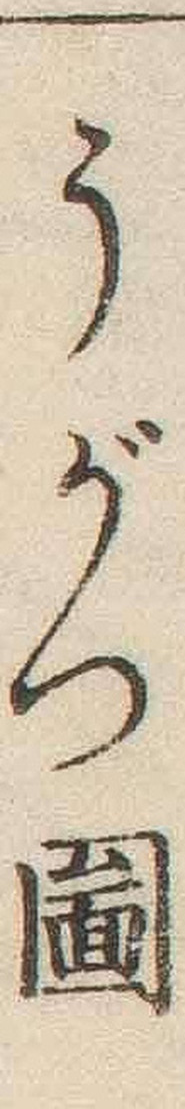うがつ圖

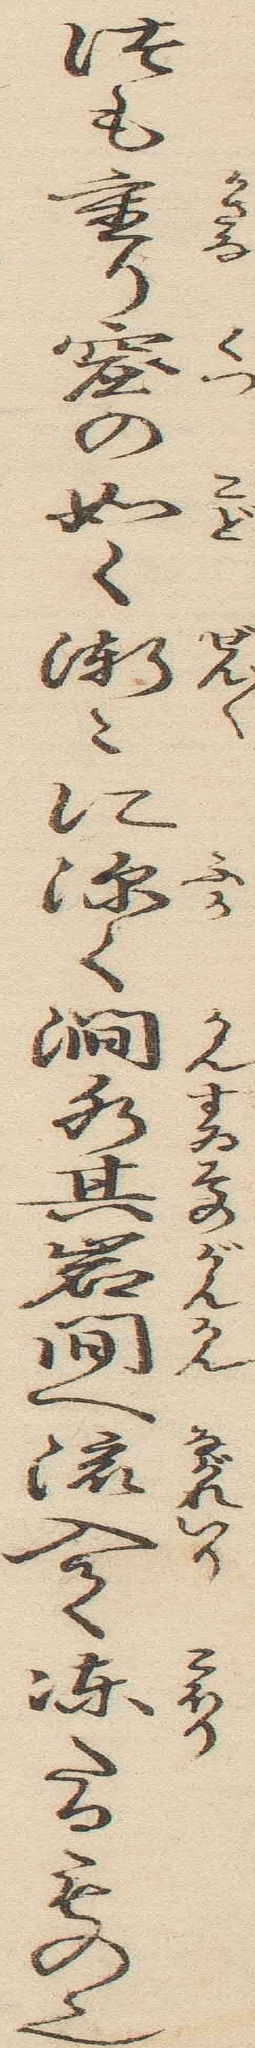つも重り窟の如く漸〻に深く澗水其岩間へ流入て凍たるもの也
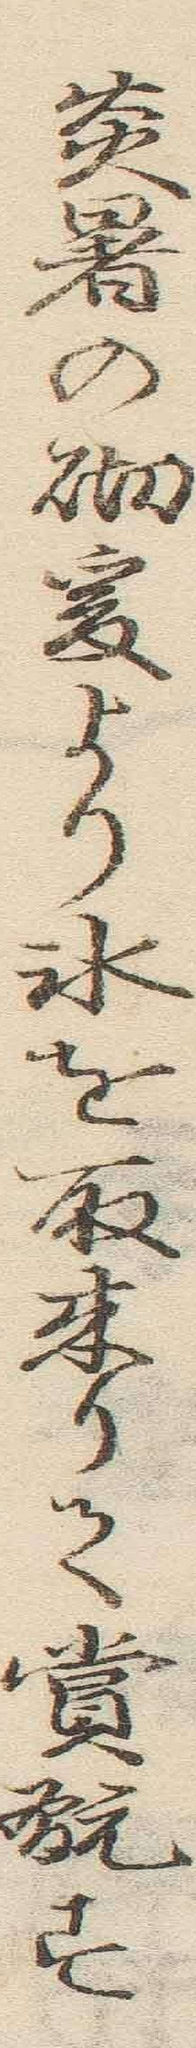炎暑の砌爰より氷を取來りて賞翫す
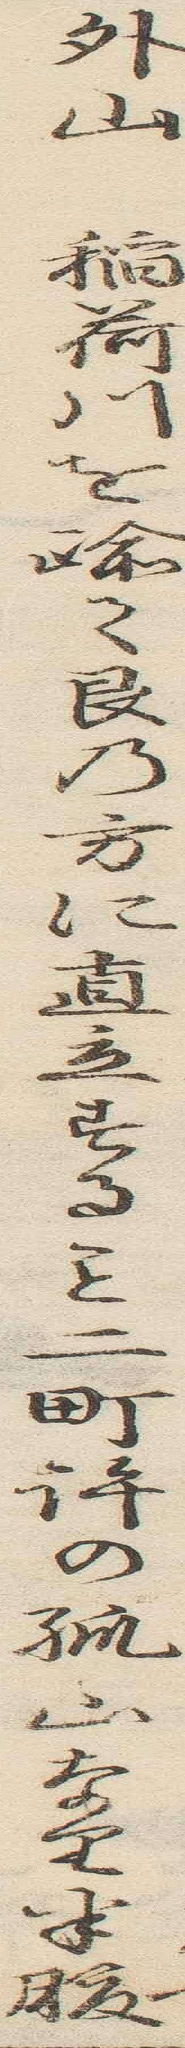外山稲荷川を踰て艮の方に直立すること二町許の孤山なり半腹
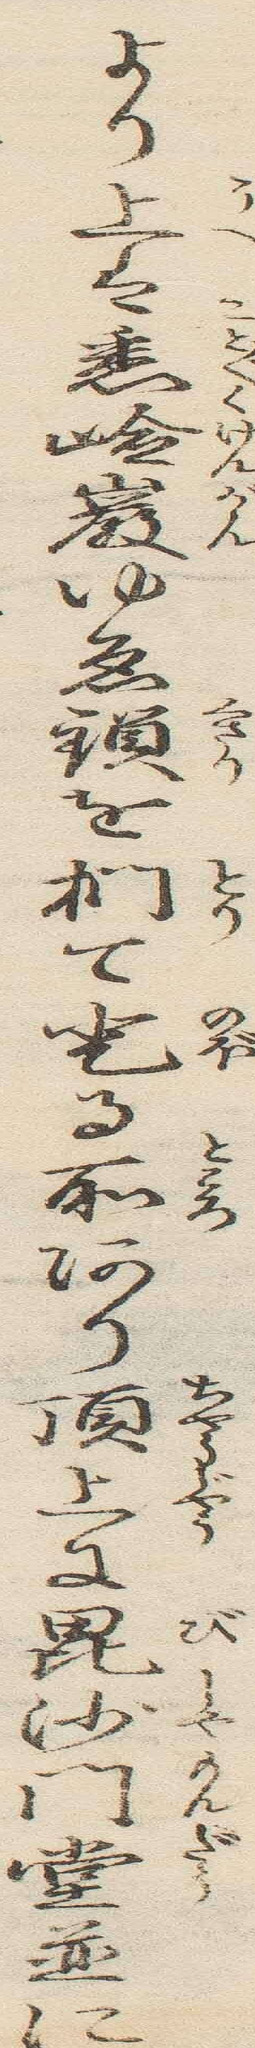より上は悉嶮巌ゆゑ鎖を捫て登る所あり頂上に毘沙門堂並に
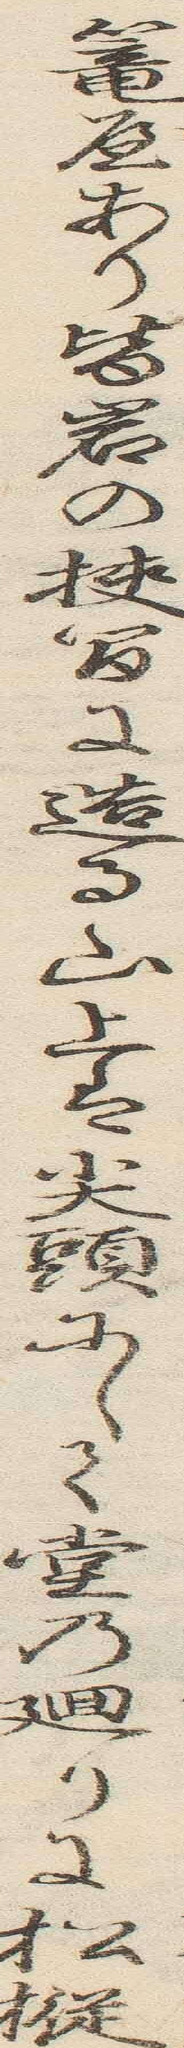篭屋あり皆岩の挟間に造る山上は尖頭にして堂の廽りに松樅
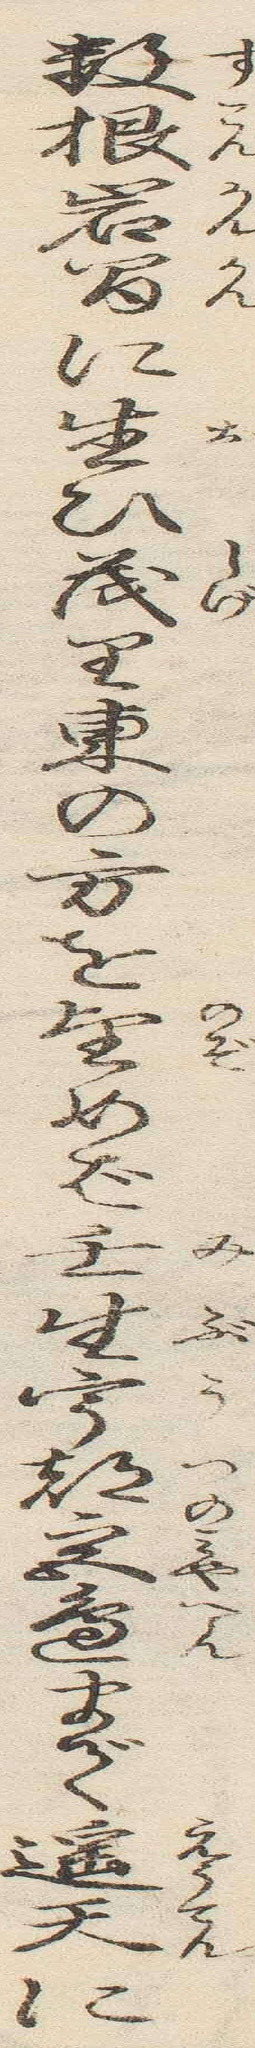数根岩間に生ひ茂り東の方を望めば壬生宇都宮邊まで遥天に
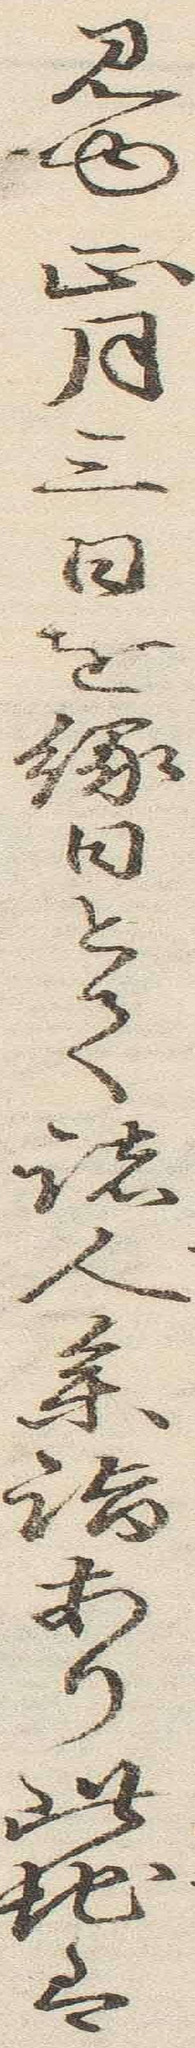見ゆ正月三日を縁日とて諸人参詣あり此地は
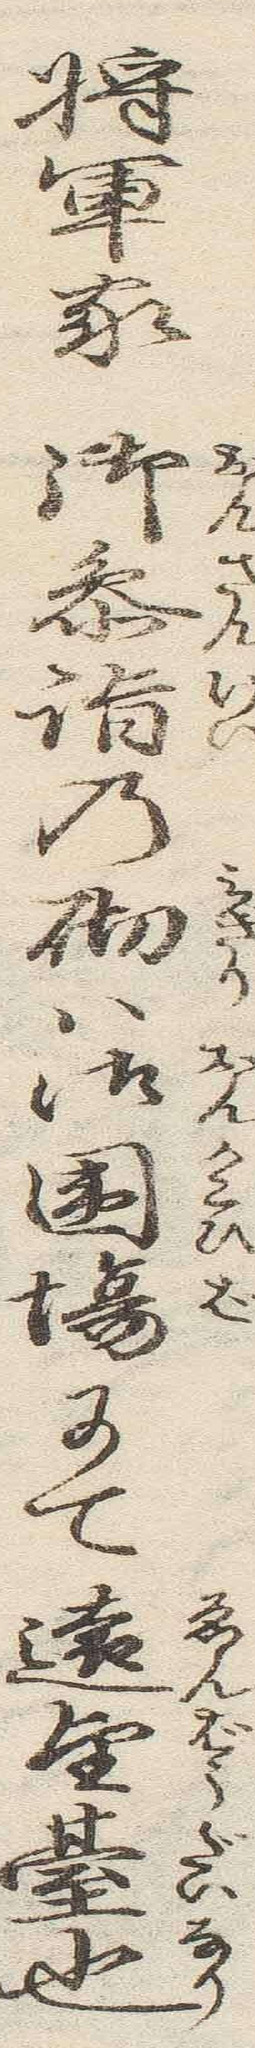将軍家御参詣の砌は御圍塲にて遠望臺也
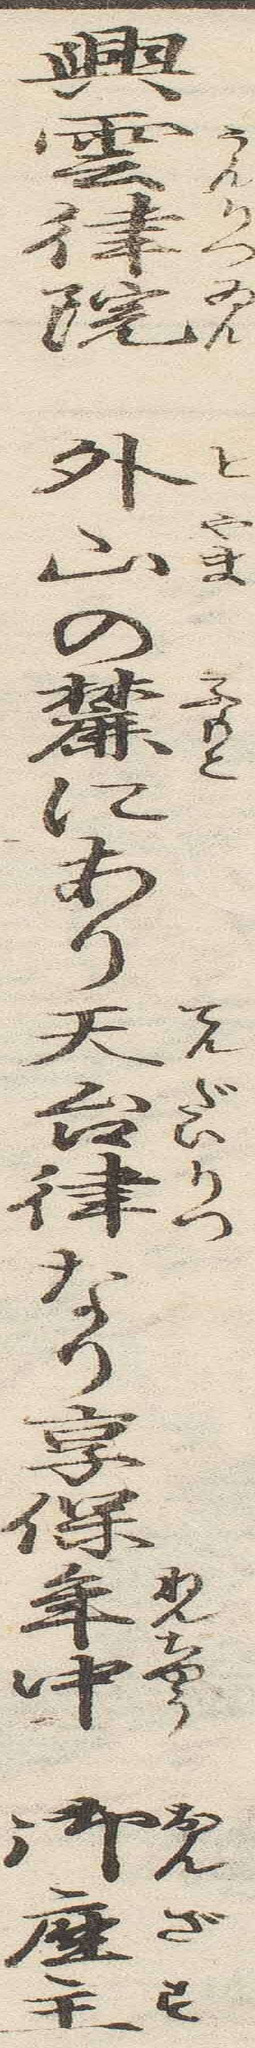興雲律院外山の麓にあり天台律なり享保年中御座主
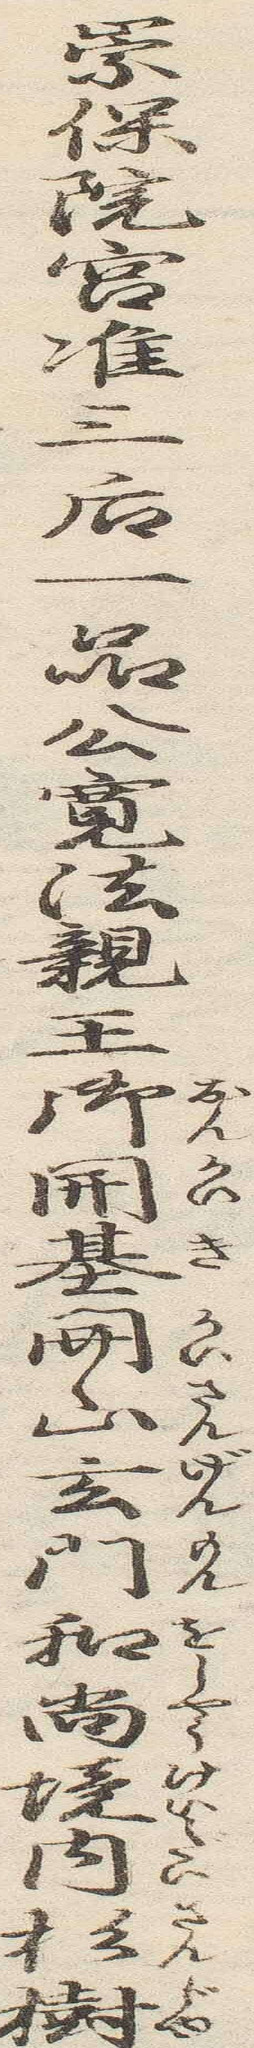崇保院宮准三后一品公寛法親王御開基開山玄門和尚境内杉樹
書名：日光山志
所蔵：東京学芸大学附属図書館 国文学研究資料館
